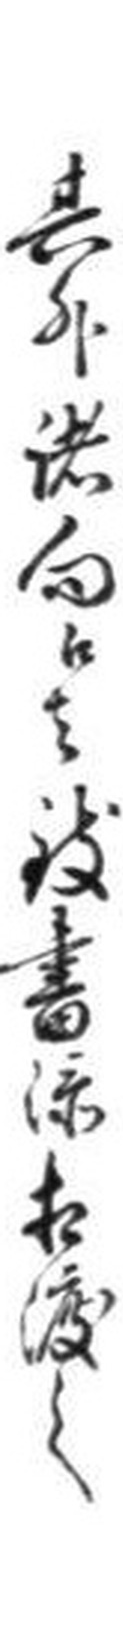其外諸向江者致書添相渡之
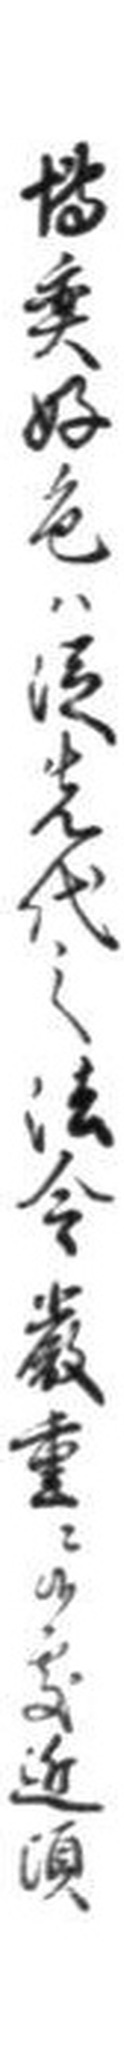博奕好色ハ従先代之法令厳重ニ候処近頃
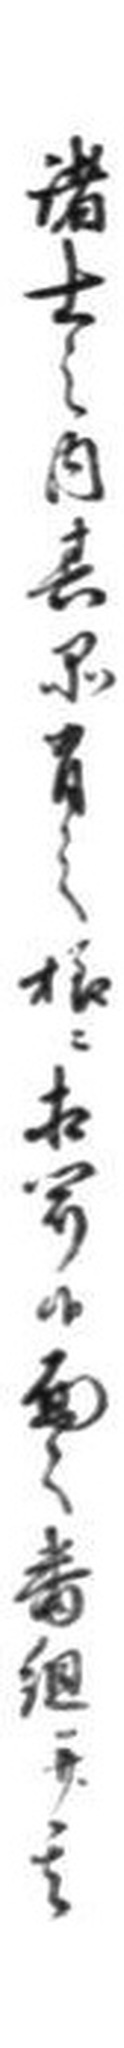諸士之内其品有之様ニ相聞候面々番組并其
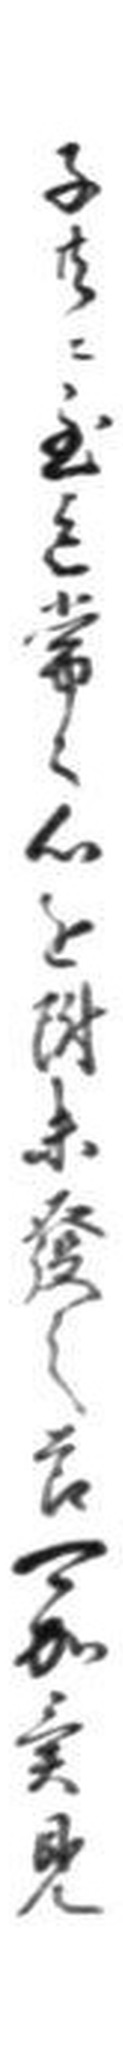子共ニ至迄常々心を付未発之節可加異見
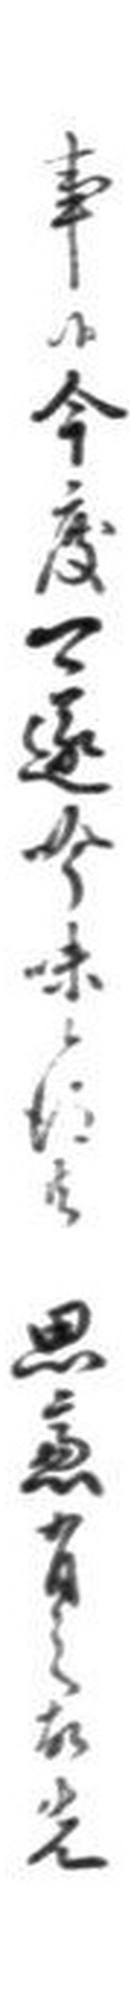事候今度可遂吟味候得共思慮有之故先
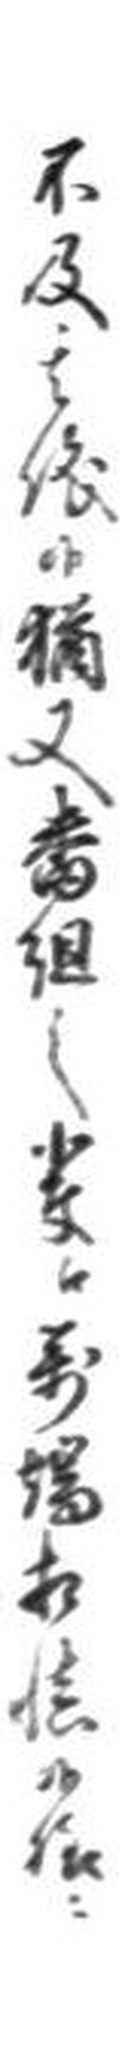不及其儀候猶又番組之輩江万端相慎候様ニ
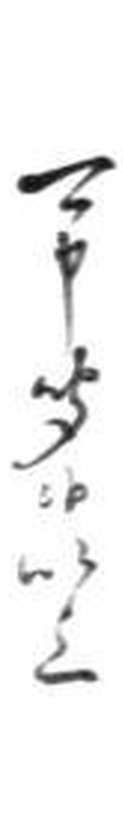可申聞候以上
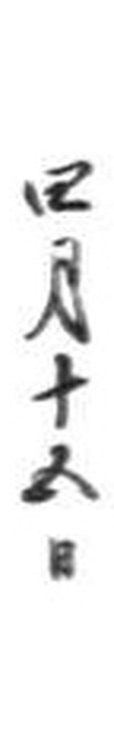四月十五日
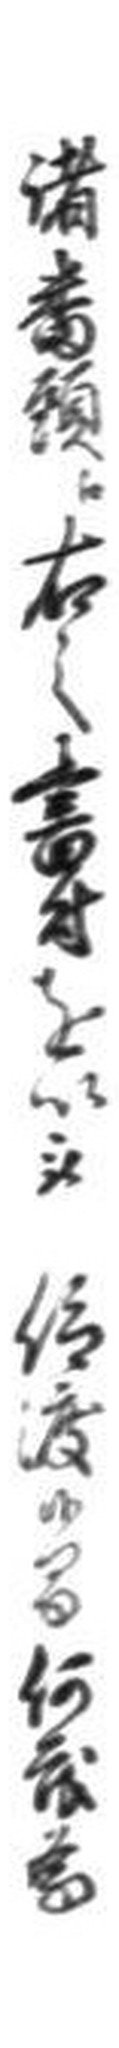諸番頭江右之書付を以被仰渡候間何茂為
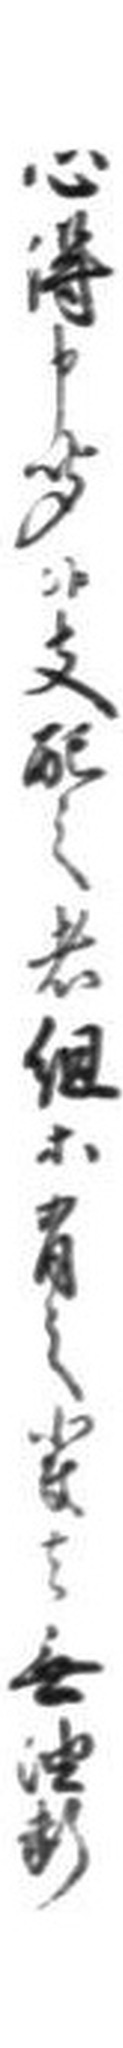心得申聞候支配之者組等有之輩者無油断
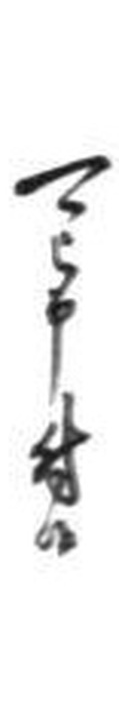可被申付候

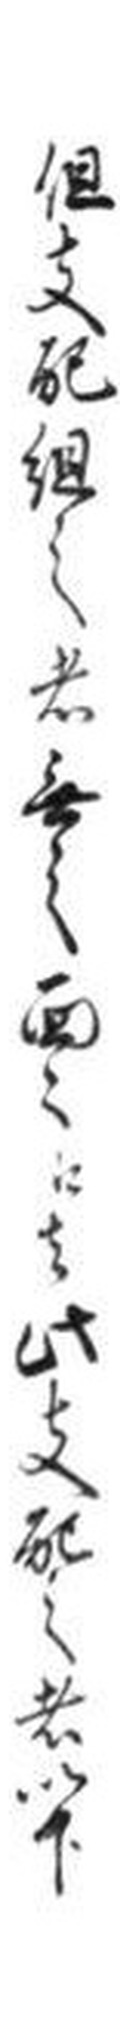但支配組之者無之面々江者此支配之者以下
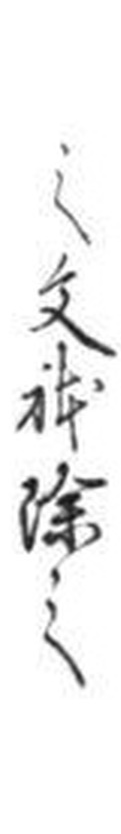之文体除之
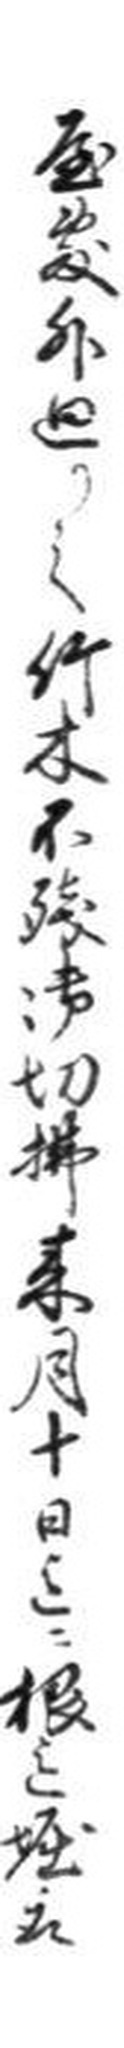屋敷外廻り之竹木不残御切払来月十日迄ニ根迄堀取
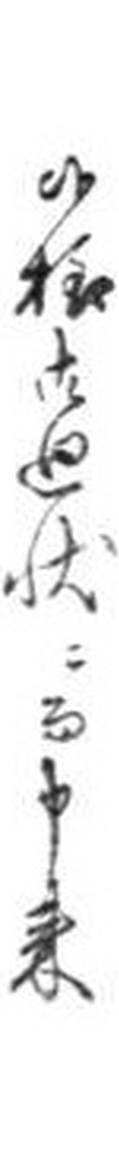候様御廻状ニ而申来
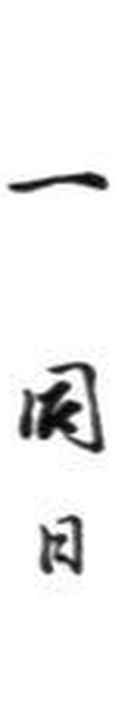一同日
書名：家譜 三十二 吉邦公 従享保二年到享保三年
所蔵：福井県文書館 Fukui Prefectural Archives
